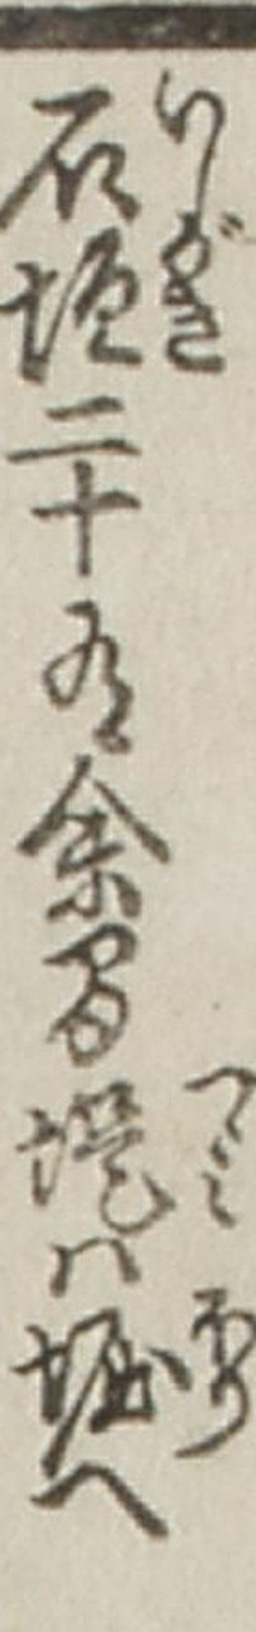石垣二十有余間堤は堀へ
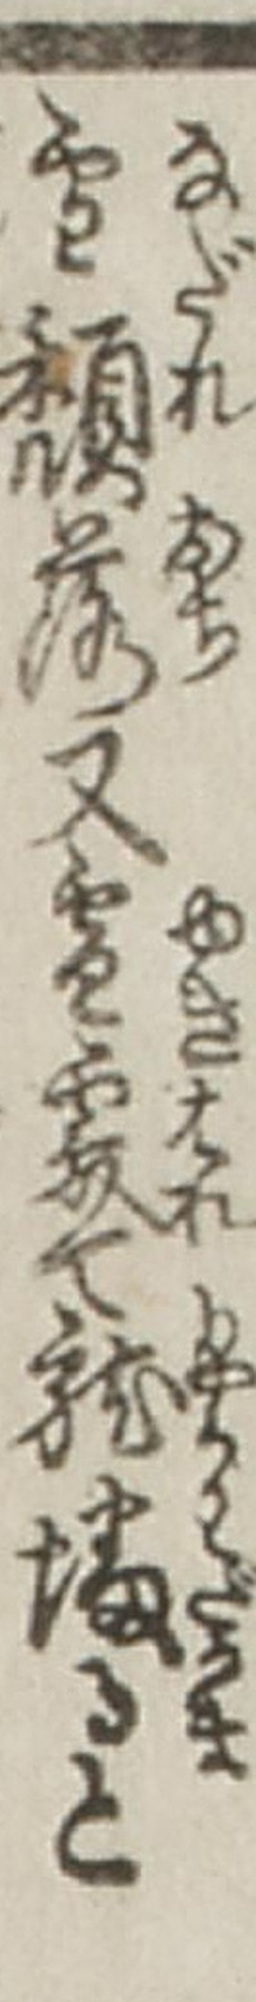雪頽落又雪霰て龍蟠ると
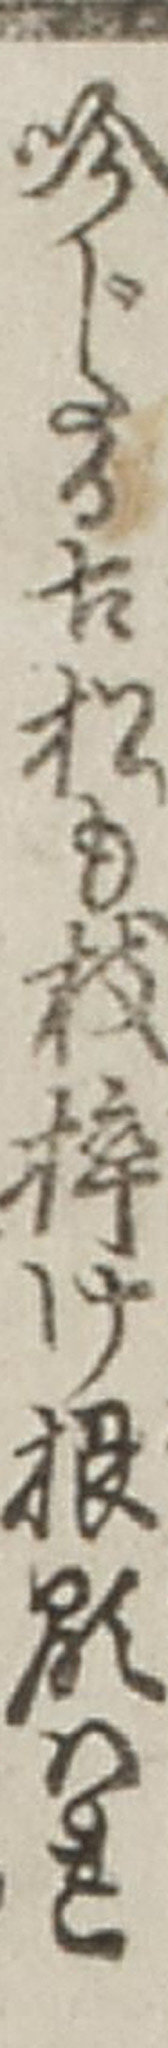吟じたる古松も枝椊け根顕はれ
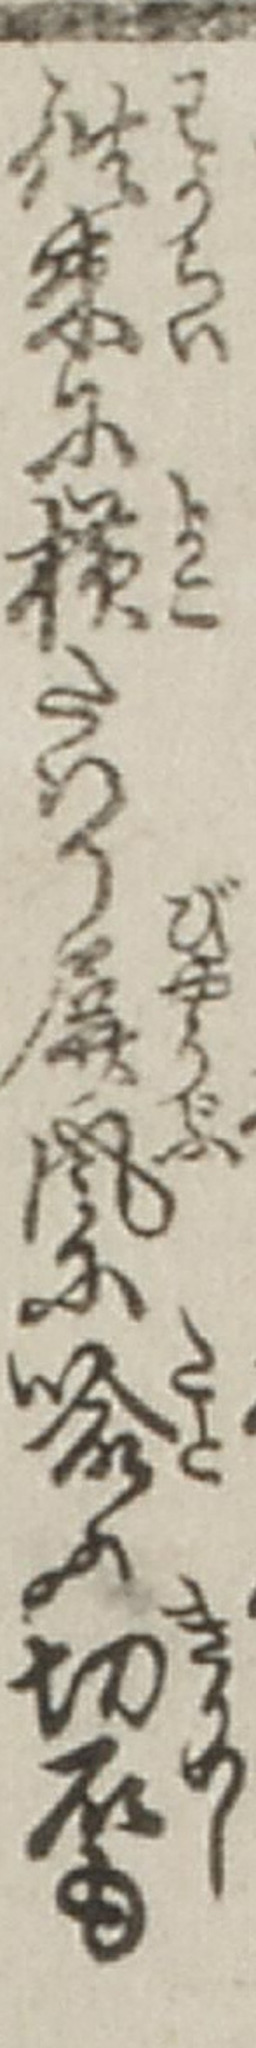往来に横たわり屏風に喩ふ切石も
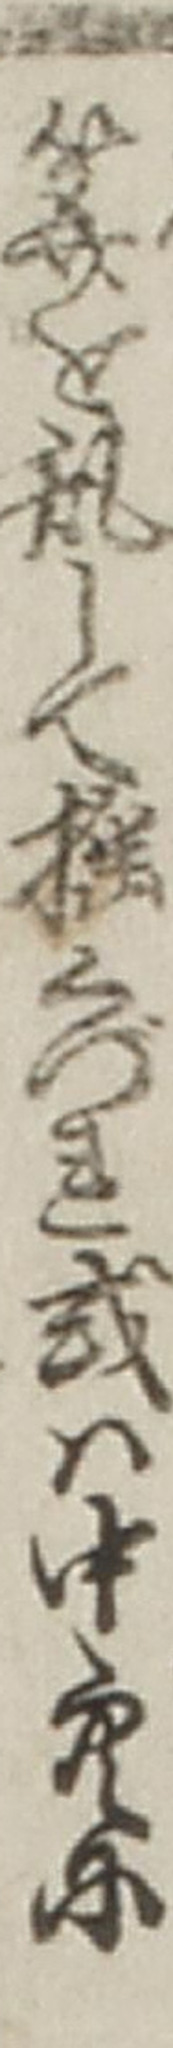算を乱して揺くづれ或は中空に
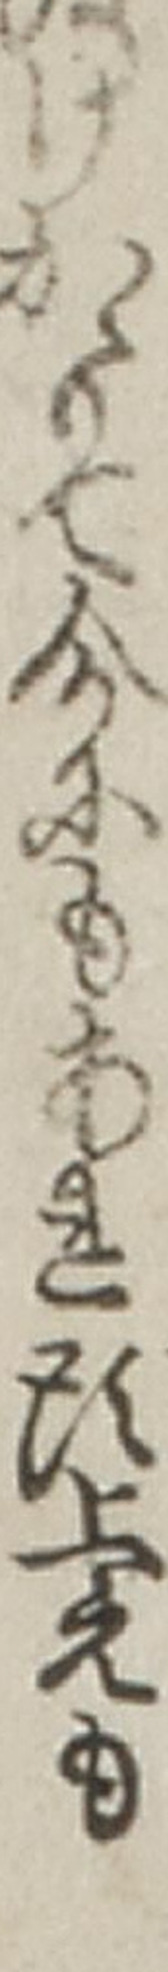ぬけかゝりて今にもあれ頭上えも
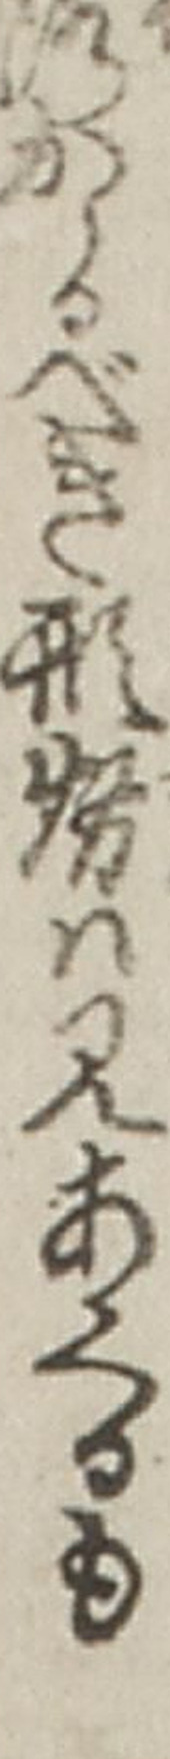落かゝるべき形勢は見あくるも
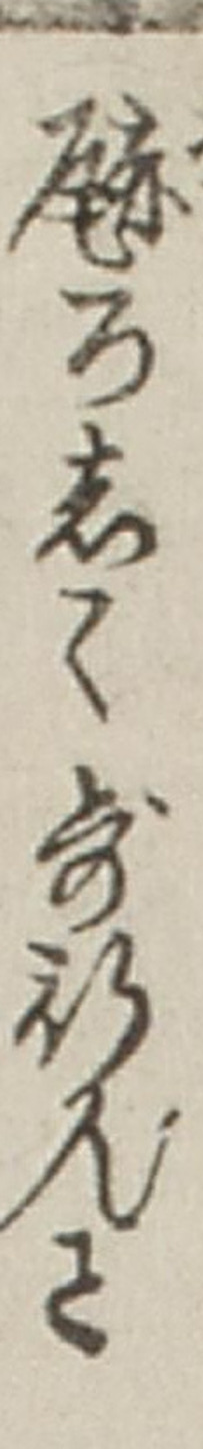酷ろしく歩行んと
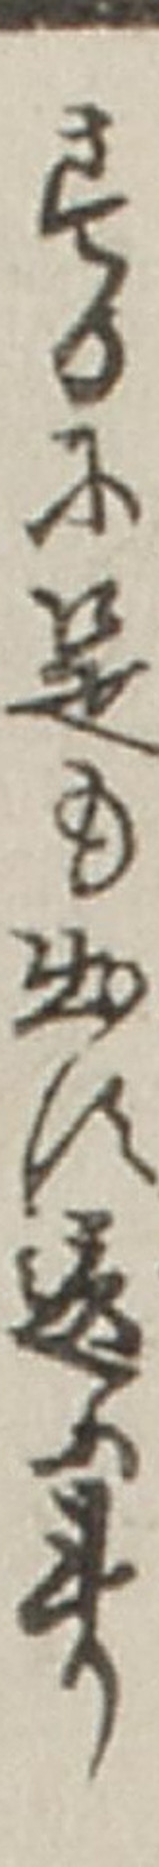するに足も出す這ふ斗り
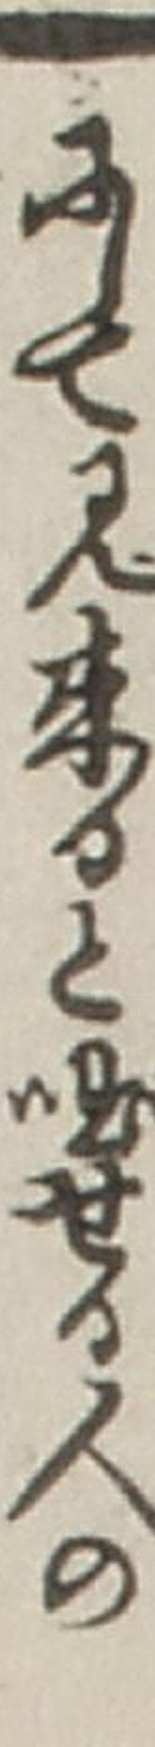にて見来ると咄せる人の
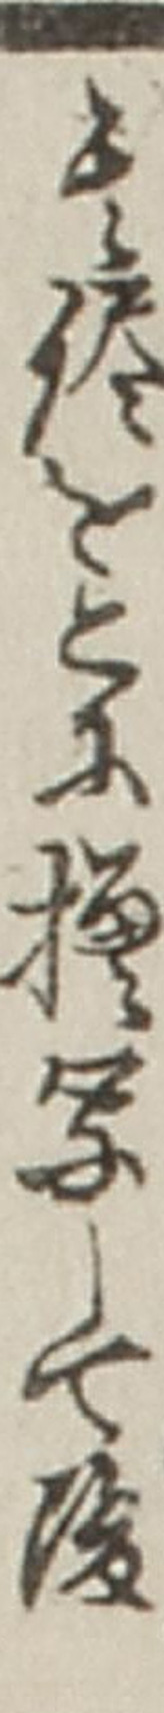其儘をこに摸写して後
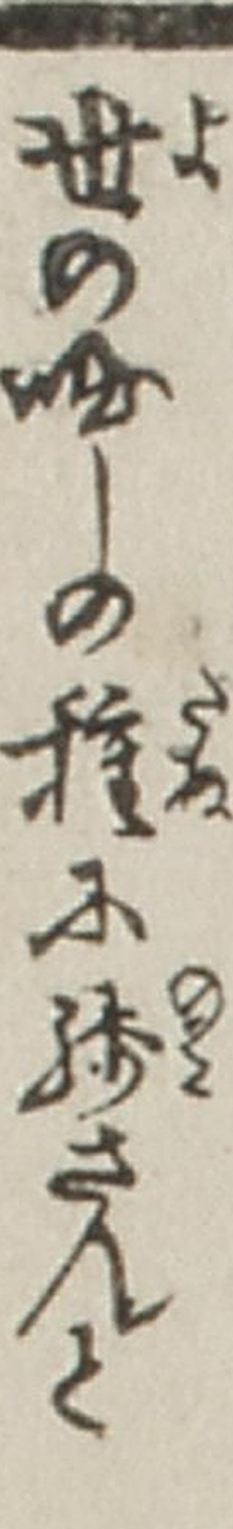世の咄しの種に残さんと
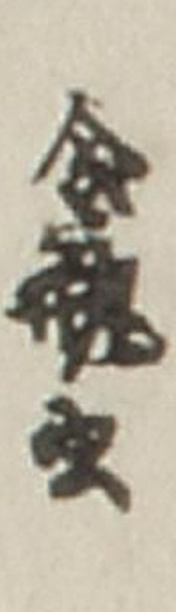金瓶書

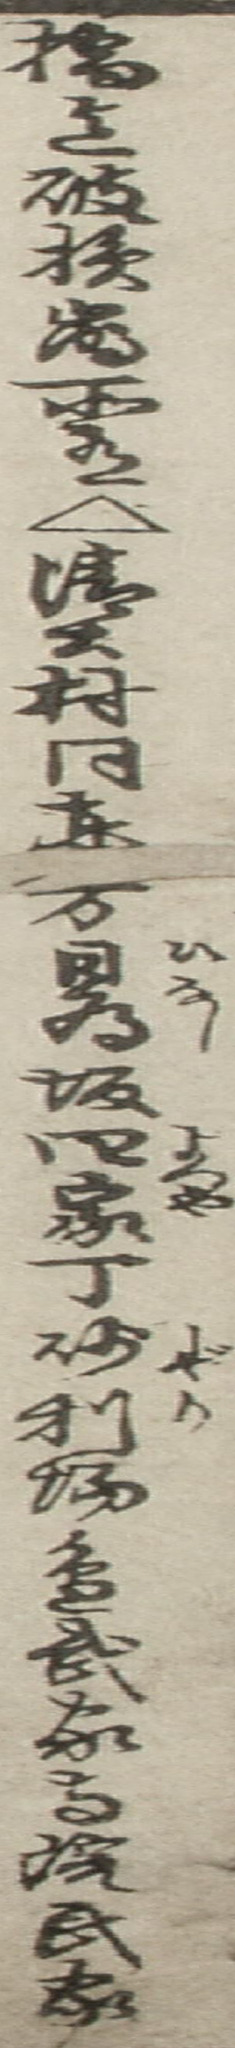橋迄破損崩所有△清土村同東方日為坂四家丁砂利場辺武家寺院民家
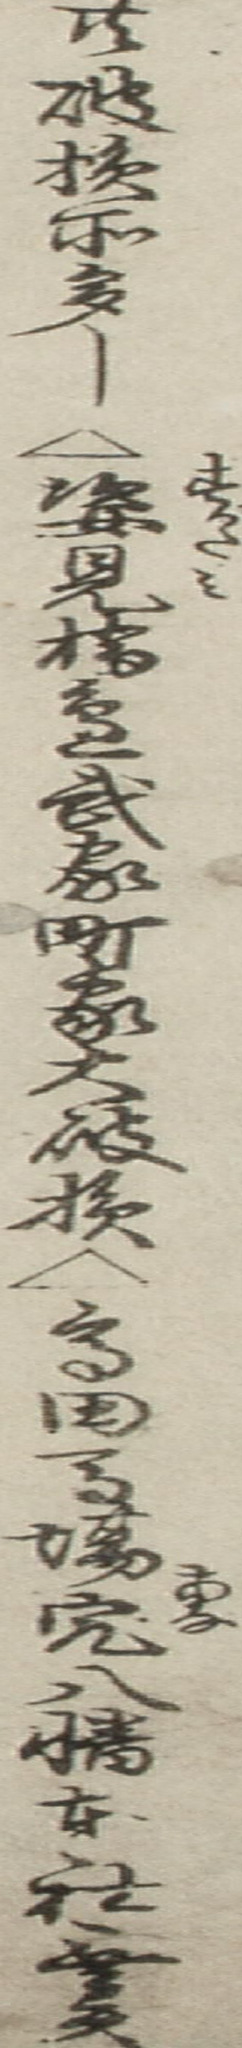共破損所多し△姿見橋辺武家町家大破損△高田馬場穴八幡本社無異
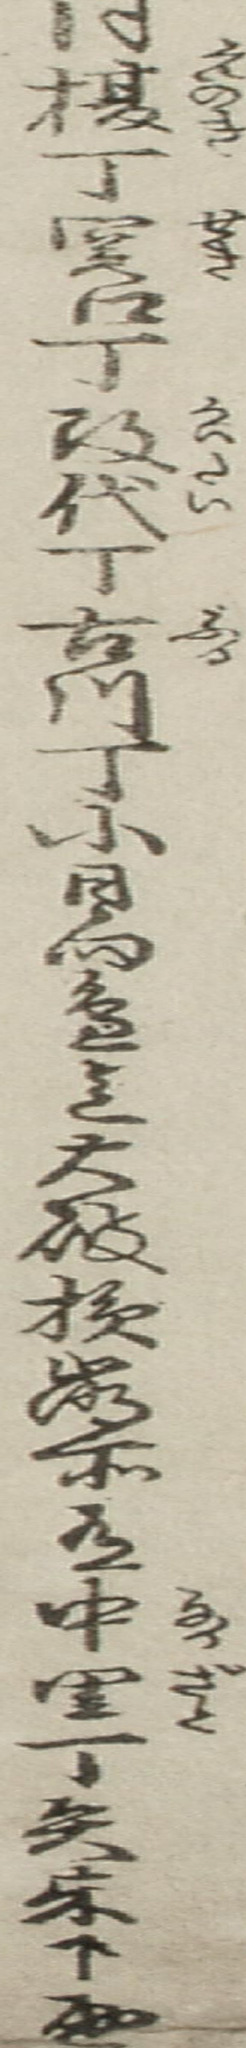同榎丁関口丁改代丁古川丁小日向辺迄大破損崩所有中里丁矢来下通
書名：安政見聞誌　下
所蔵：東京大学地震研究所図書室 Earthquake Research Institute Library, The University of Tokyo, JAPAN
